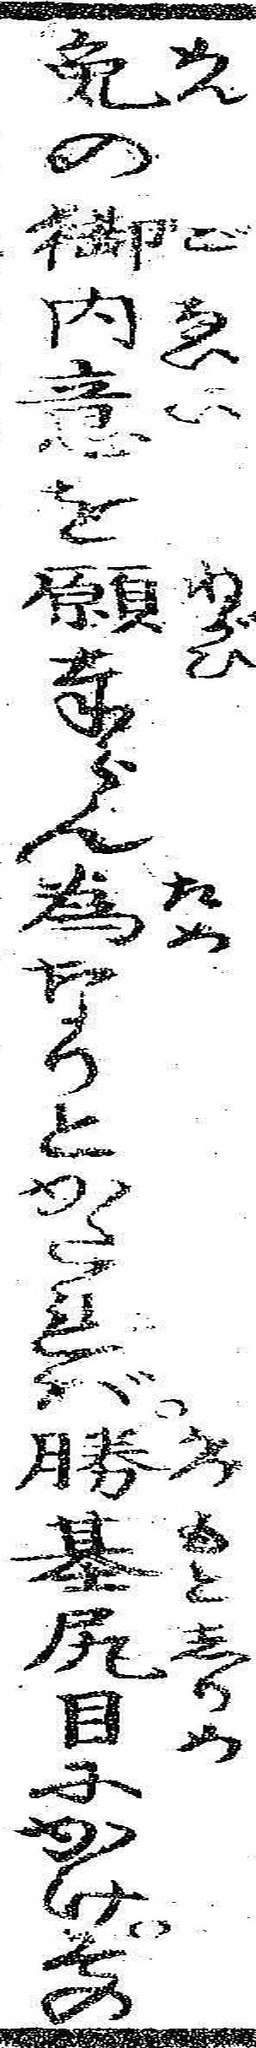免の御内意を願奉らん為なりとかたれば。勝基尻目にかけ。その
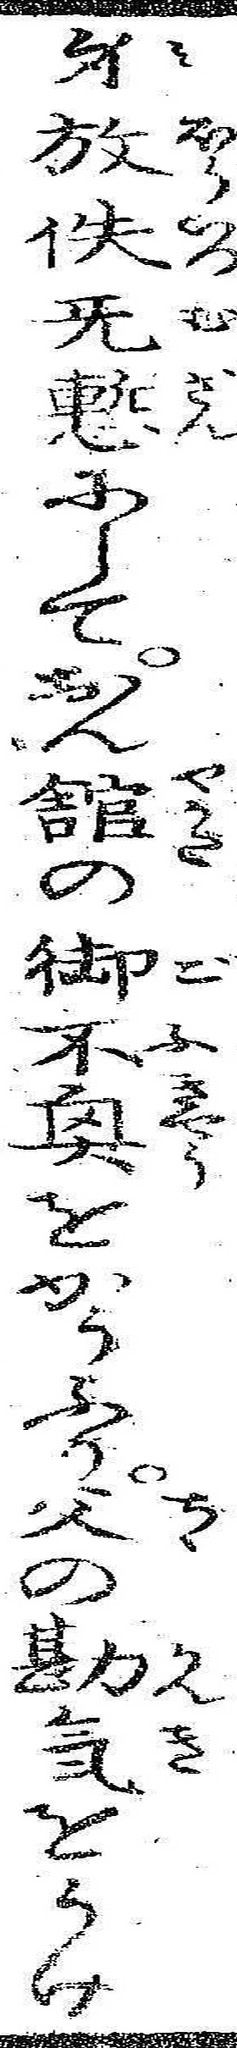身放佚無慙にして。おん館の御不興をかうふり。父の勘気をうけ
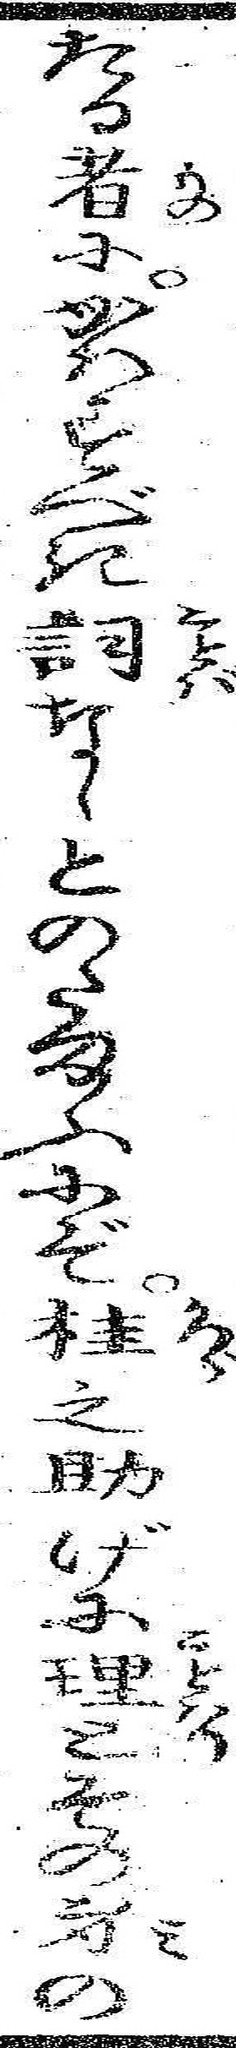たる者に。かはすべき詞なしとのたまふにぞ。桂之助げに理とその身の
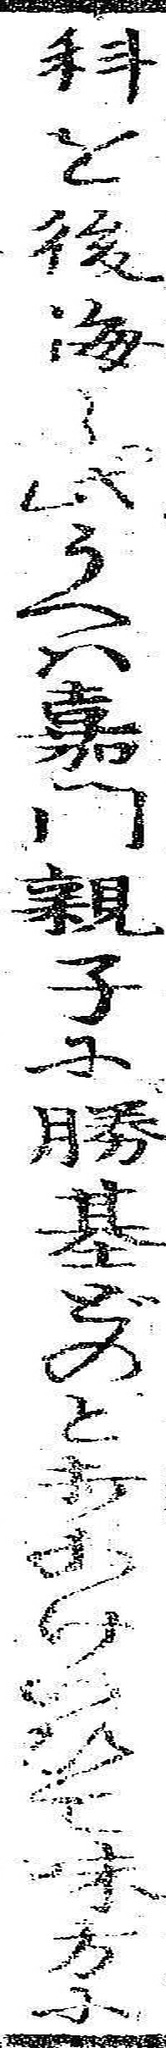科を後悔し。此うへは嘉門親子に。勝基どのと打あけいひて味方に
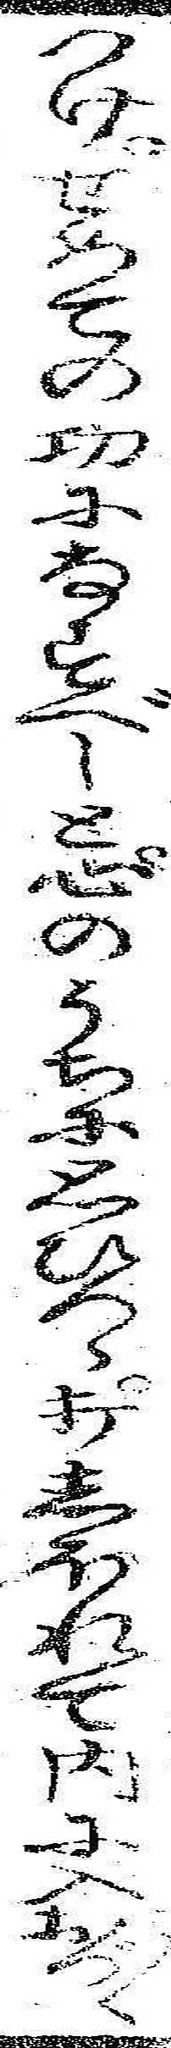つけ。せめての功になすべしと。心のうちに思ひつゝ。打しほれて内に入。おづ〳〵
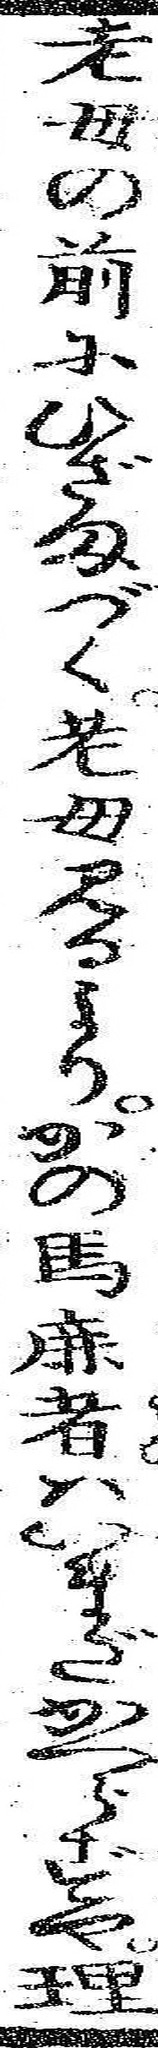老母の前にひざまづく。老母見るより。かの馬鹿者はいまだかへらずや。理
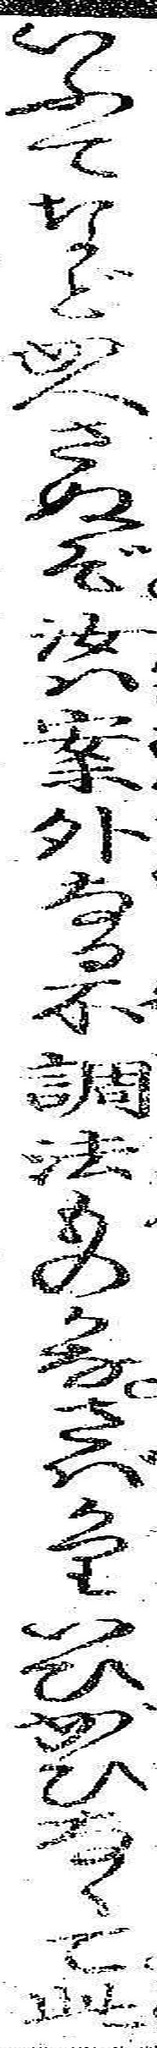いふてなどかへさぬぞ。汝は案外なる不調法ものかな。さばかりいひがひなくて。此
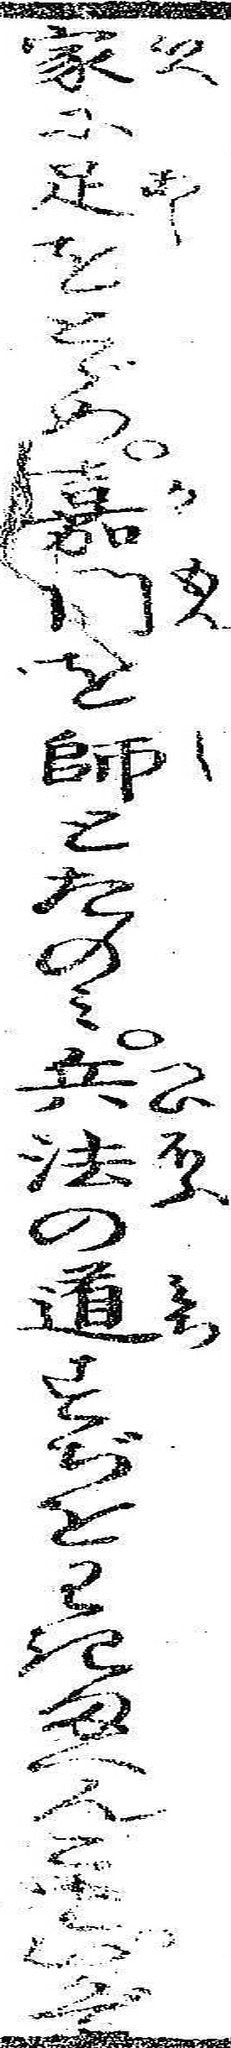家に足をとゞめ。嘉門を師とたのみ。兵法の道すぢをわきまへんこと。いかで
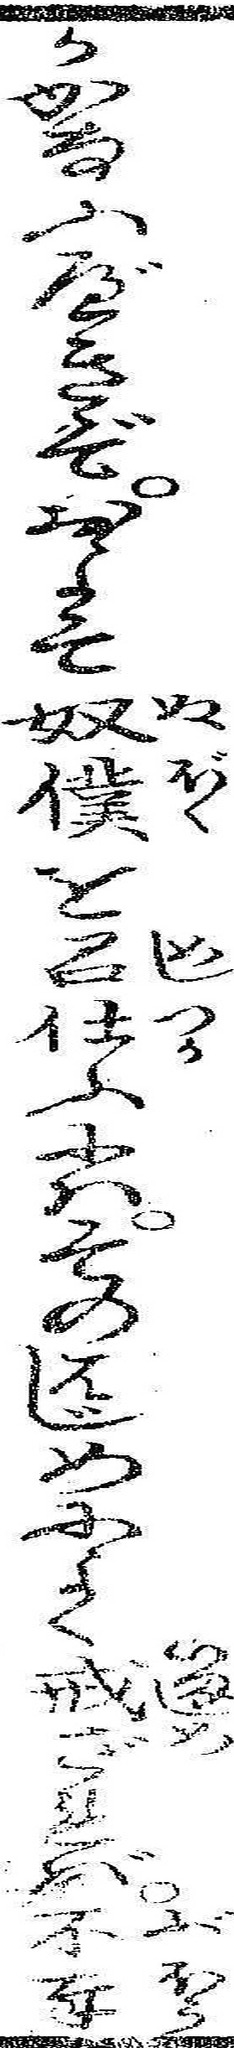かかなふべきぞ。およそ奴僕を召仕ふには。そのはじめによく戒ざれば。不奉
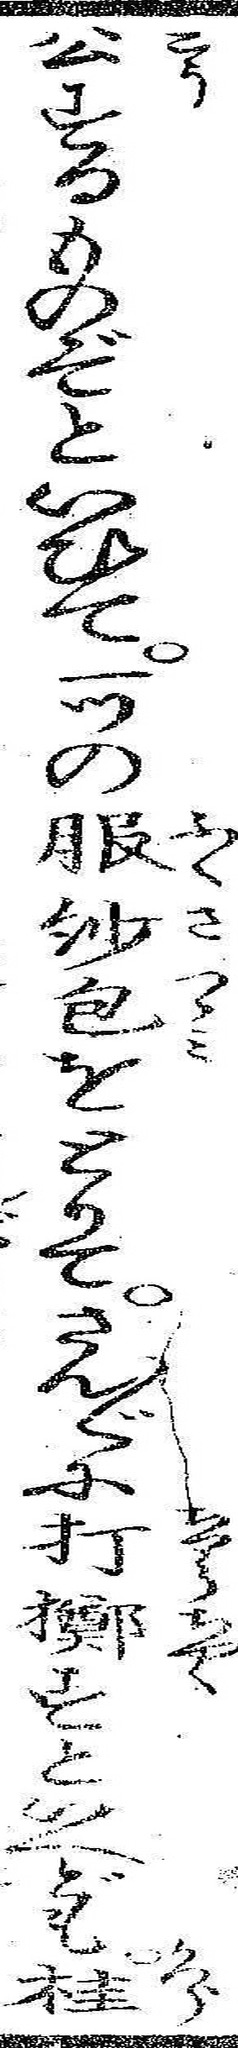公するものぞといひて。一ツの服紗包をとりて。さんん〴〵に打擲すといへども。桂
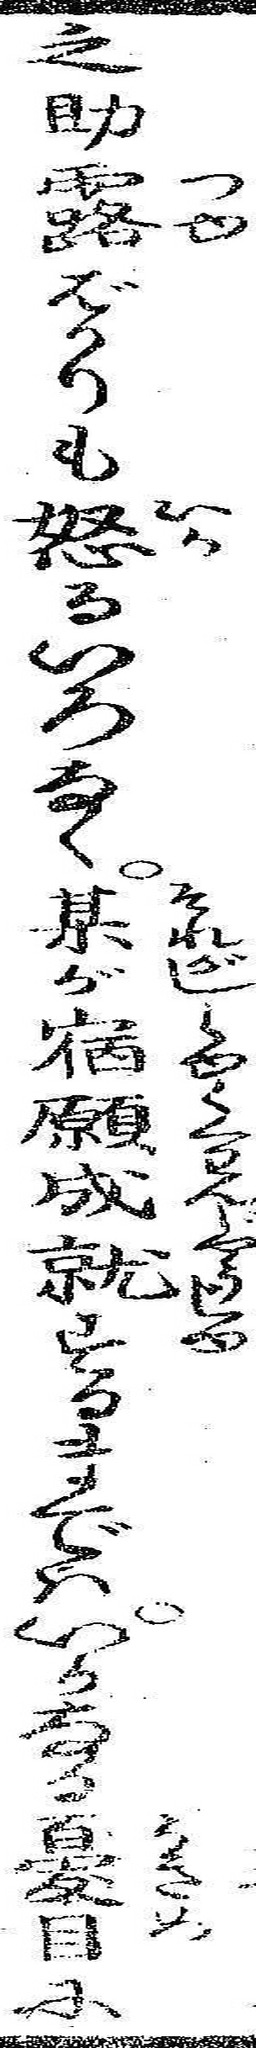之助露ばかりも怒るいろなく。某が宿願成就するまでは。いかなる憂目に
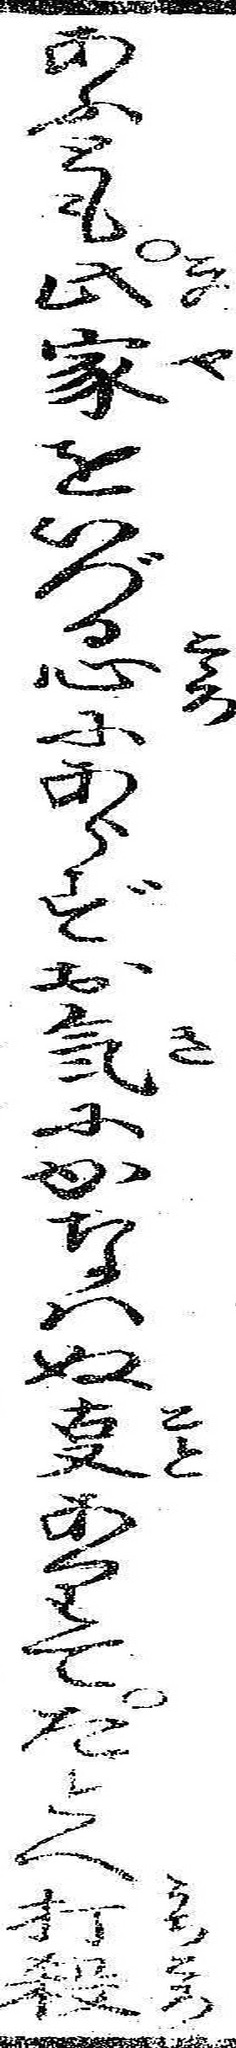あふとも。此家をいづる心にあらずお気にかなはぬ事ありて。たとへ打殺
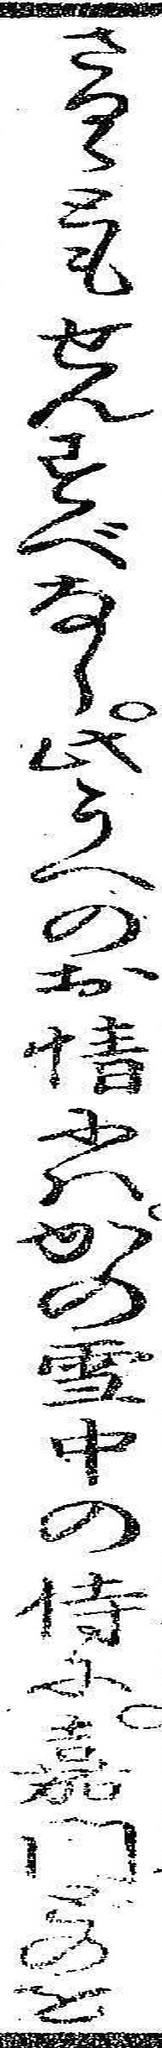さるゝともせんすべなし。此うへのお情には。かの雪中の侍に。嘉門どのを
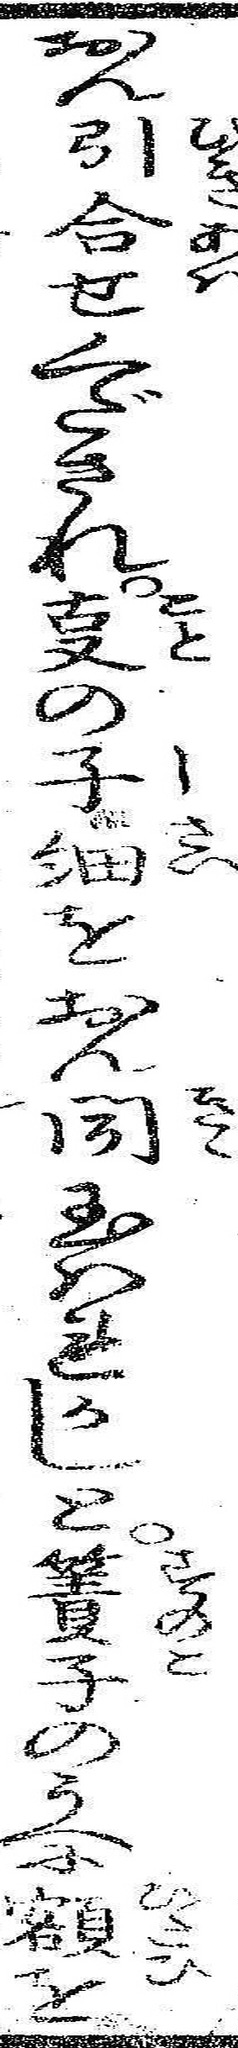おん引合せくだされ。事の子細をおん聞玉はれかしと。簀子のうへに額を
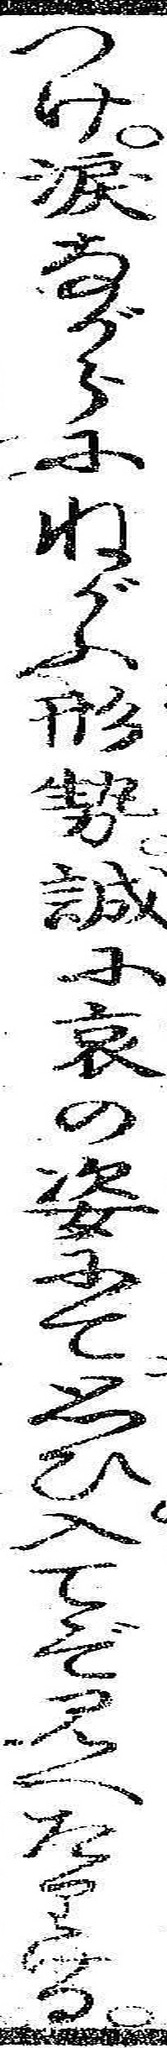つけ。涙ながらにねがふ形勢。誠に哀の姿にて。思ひ入てぞ見へたりける。
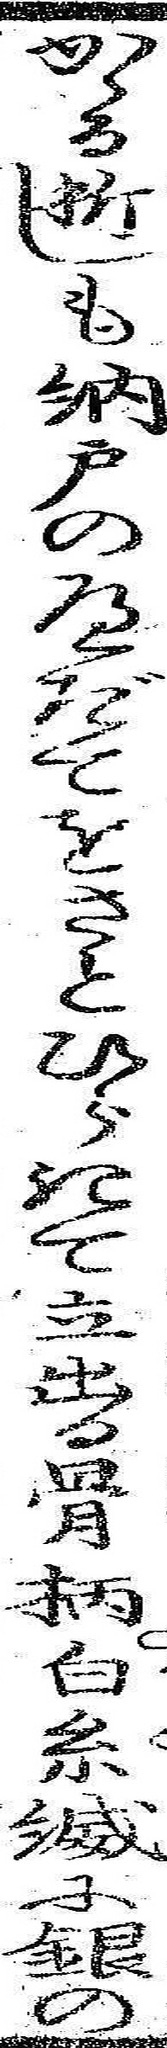かゝる折しも納戸のへだてをさとひらきて立出る骨柄。白糸縅に銀の
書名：昔話稲妻表紙
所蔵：国文学研究資料館
